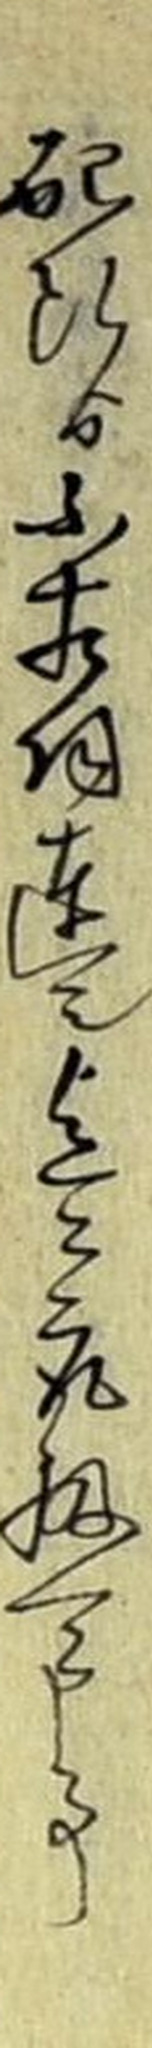配頭ゟ不相伺達シ迄ニ取扱可申事
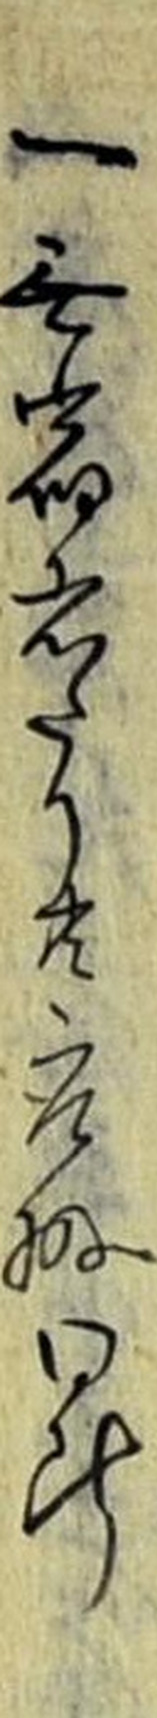一無宿者たり共取扱同断
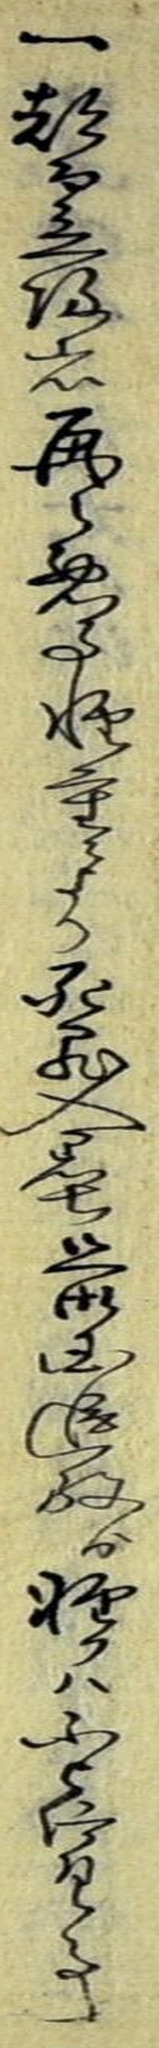一都而立帰者再之悪事軽重ニより死罪入墨且御国追放ゟ軽クハ不被仰付候事

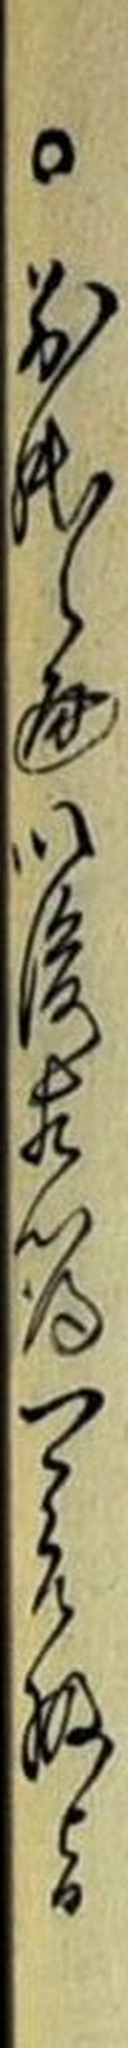〇別紙之通以後相心得可取扱旨

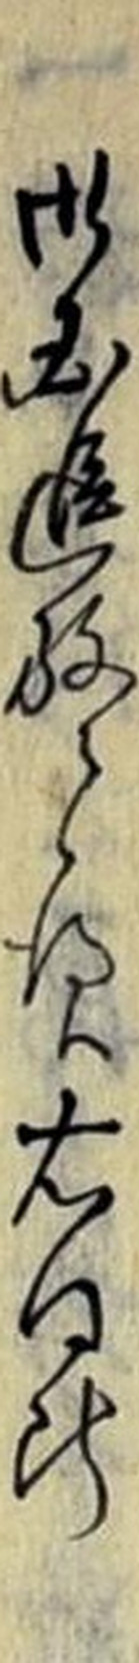御国追放ニ候得ハ右同断
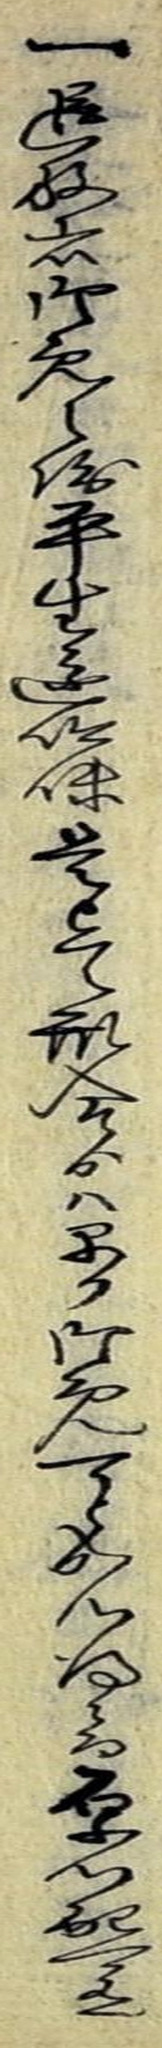一追放者御免之儀平生遂吟味是迄之形合ゟハ早ク御免可被成心得ニ而厚心配可有
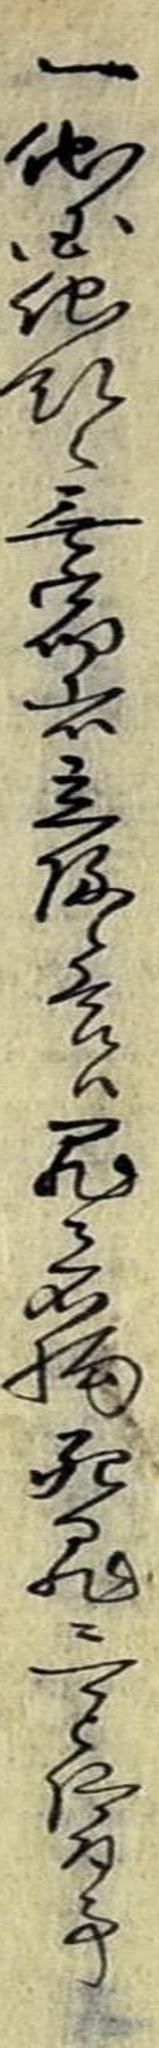一他国他領へ無宿者立帰候節ハ罪ニ不拘死罪ニ可被仰付事
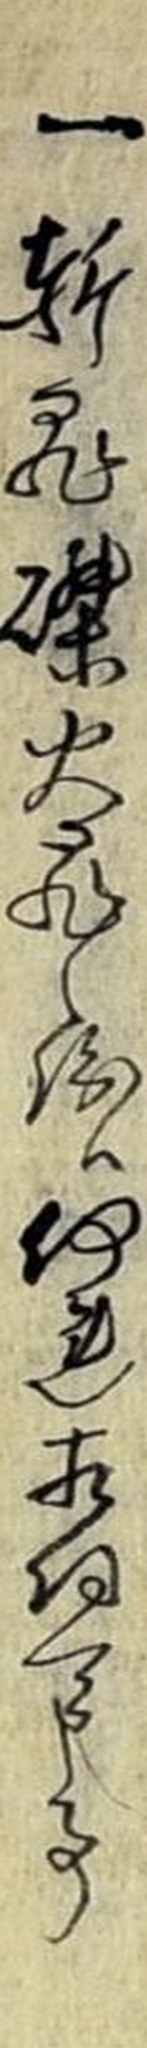一斬罪磔火罪之儀ハ何連相伺可申事
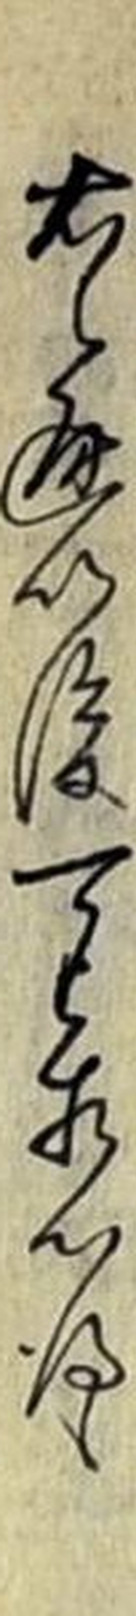右之通以後可被相心得候
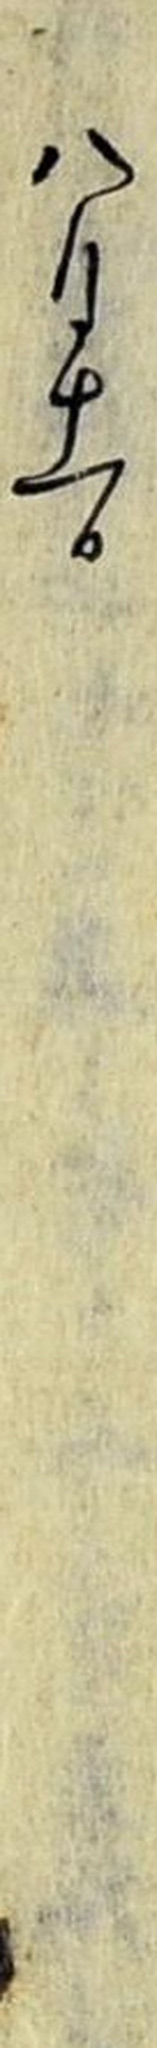八月十一日
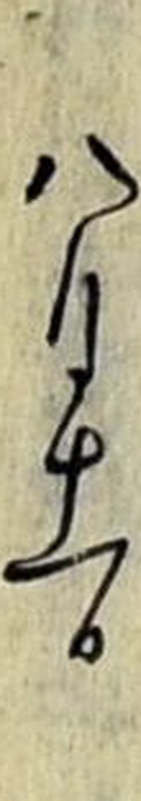八月十一日
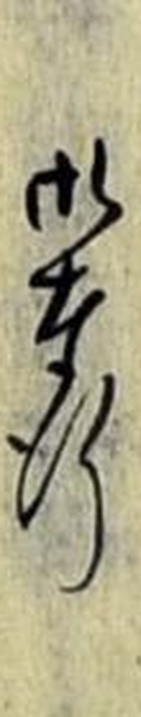御奉行
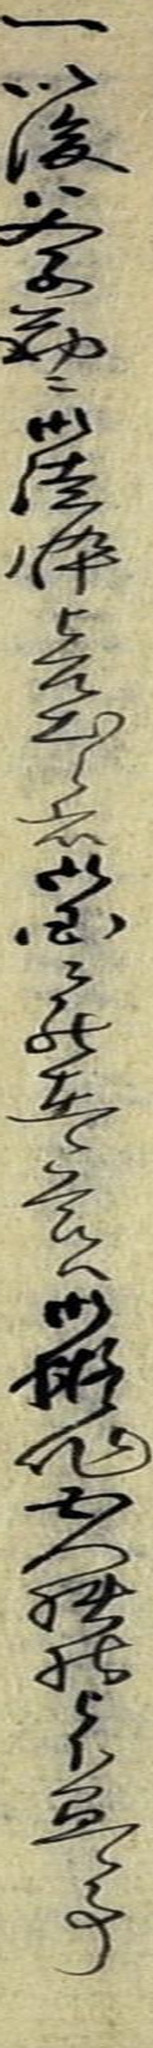一以後父子勤ニ御徒忰被召出候者御国ニ罷在候節ハ御擬作五人扶持被下置候事
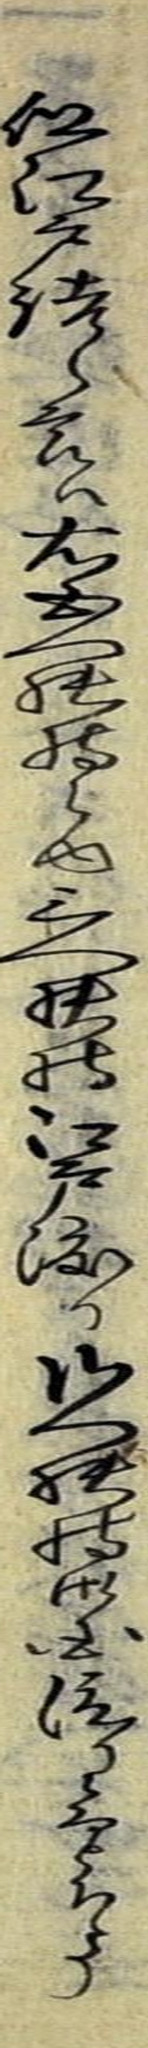但江戸詰之節ハ右五人扶持之内三人扶持江戸渡り弐人扶持御国渡りニ而被下候事
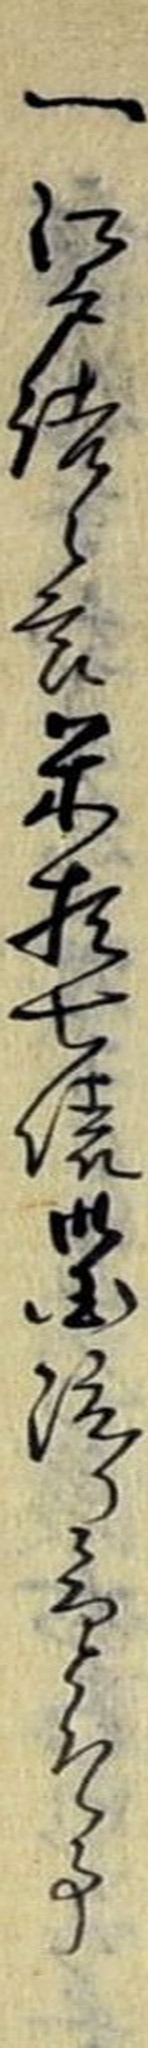一江戸詰之節米拾七俵御国渡りニ而被下候事
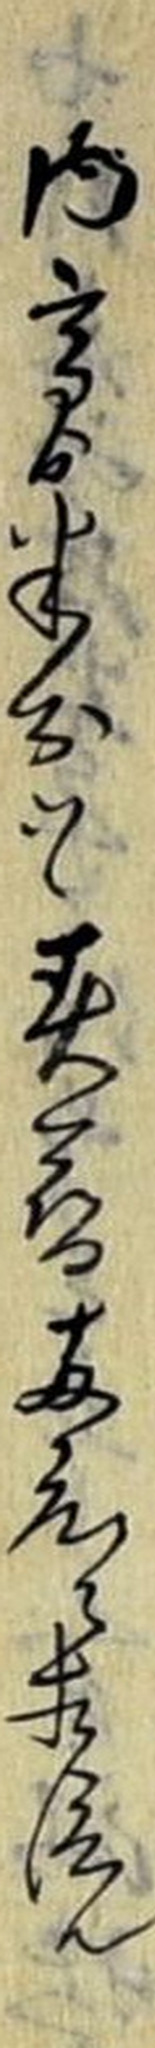内高ゟ半分ツヽ春暮両度ニ相渡ル
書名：命令之部 三
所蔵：福井県文書館 Fukui Prefectural Archives
